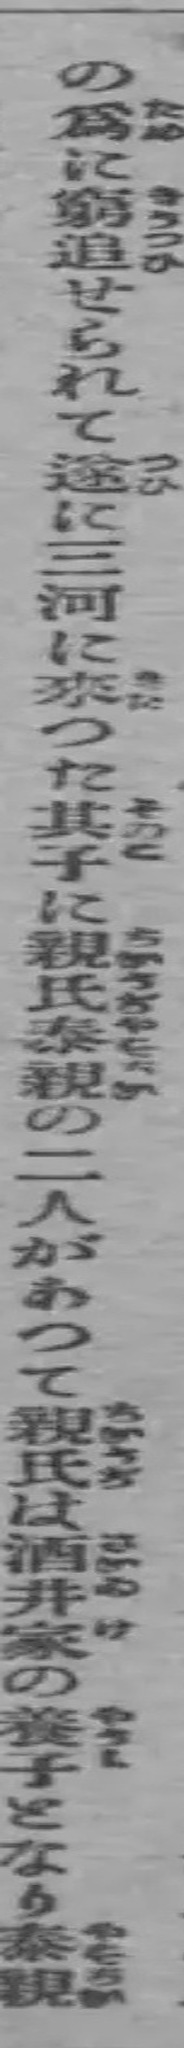の為に窮追せられて遂に三河に来つた其之に親氏泰親の二人があつて親氏は酒井家の養子となり泰親
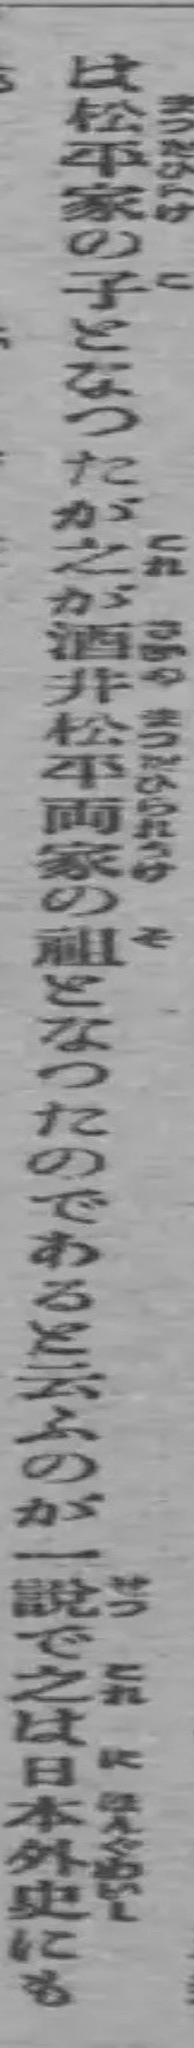は松平家の子となつたが之が酒井松平両家の祖となつたのであると云ふのが一説で之は日本外史にも
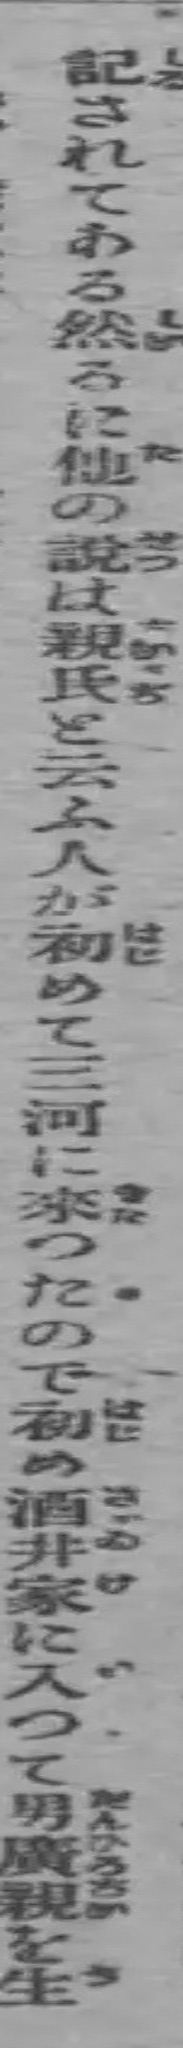記されてある然るに他の説は親氏と云ふ人が初めて三河に来つたので初め酒井家に入つて男広親を生
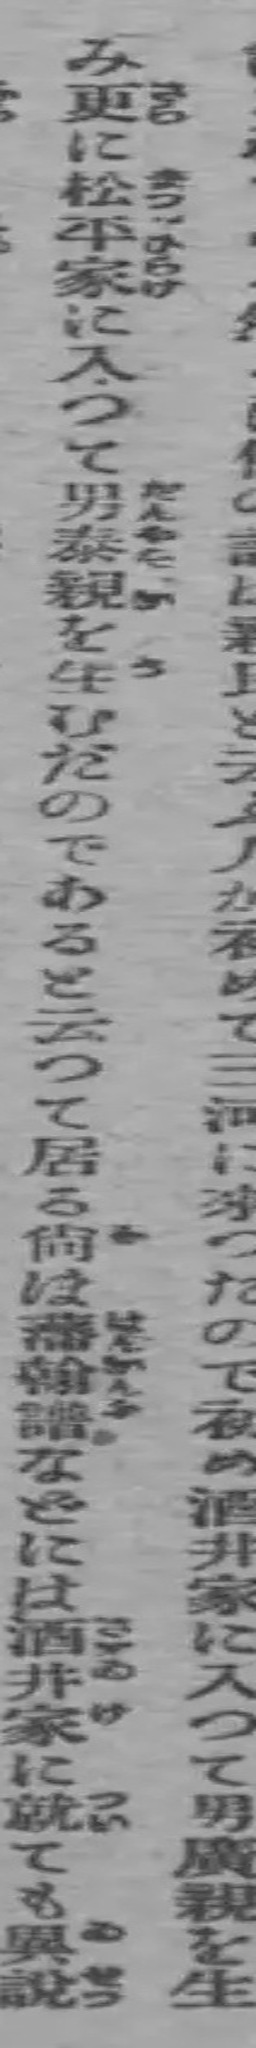み更に松平家に入つて男泰親を生むだのであると云つて居る尚ほ藩翰譜などには酒井家に就ても異説
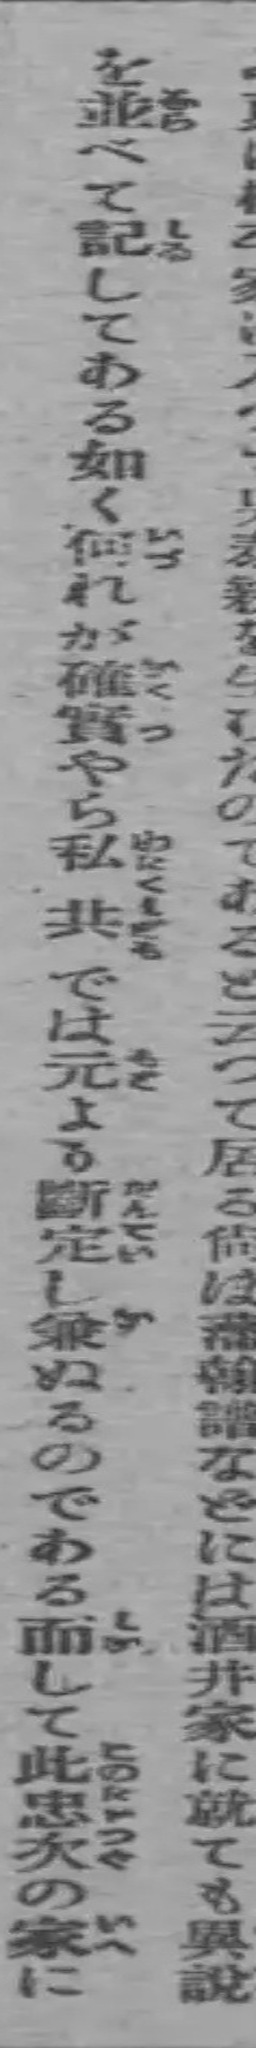を並べて記してある如く何れが確実やら私共では元より断定し兼ぬるのである而して此忠次の家に
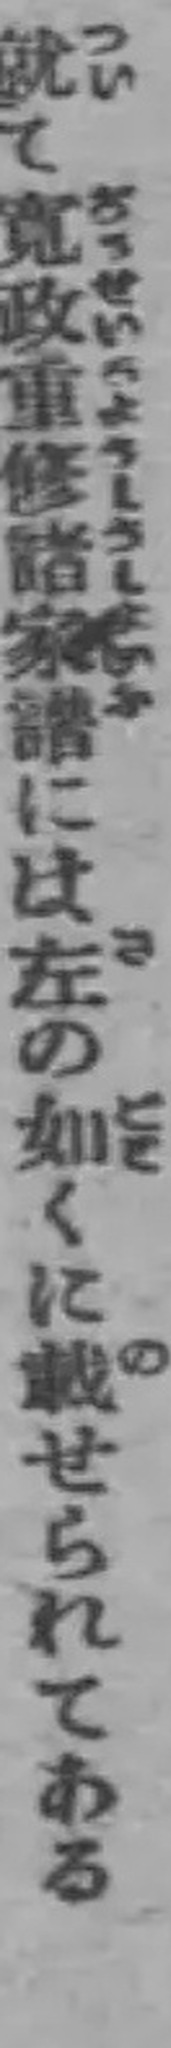就て寛政重修諸家譜には左の如くに載せられてある
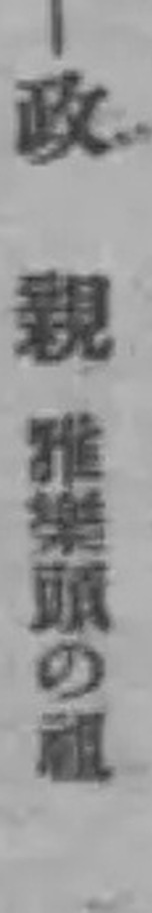政親雅樂頭の祖
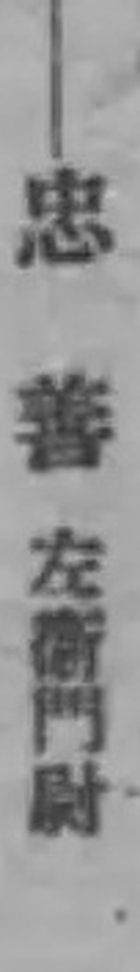左衛門尉
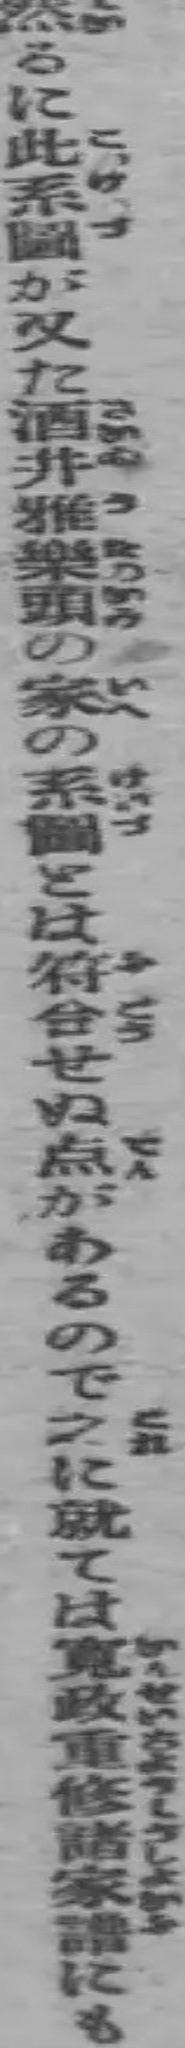然るに此系図が又た酒井雅樂頭の家の系図とは符号せぬ点があるので之に就ては寛政重修諸家譜にも
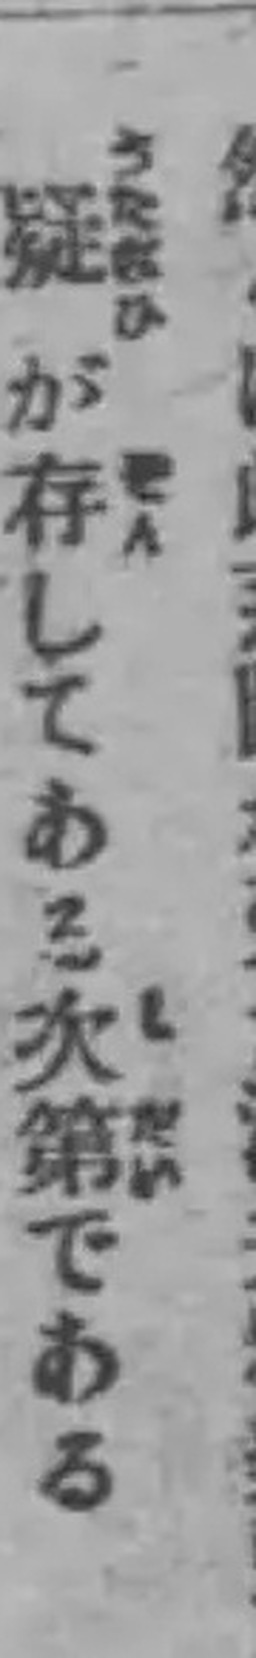疑が存してある次第である
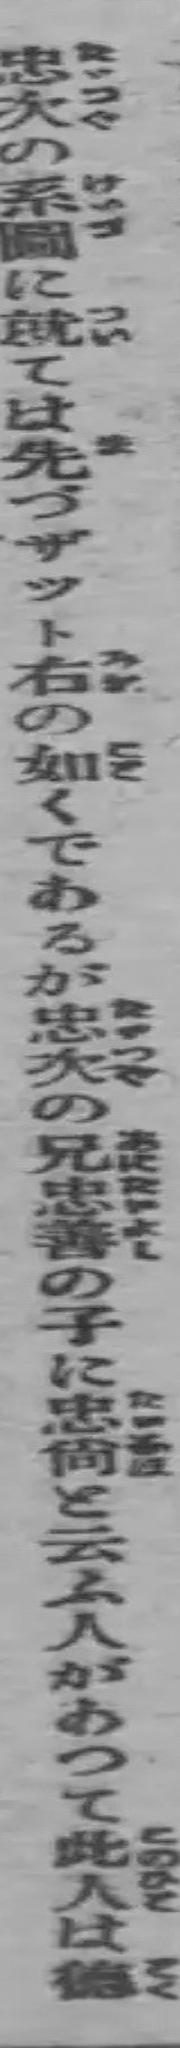忠次の系図に就ては先づザツト右の如くであるが忠次の兄忠善の子に忠尚と云ふ人があつて此人は徳
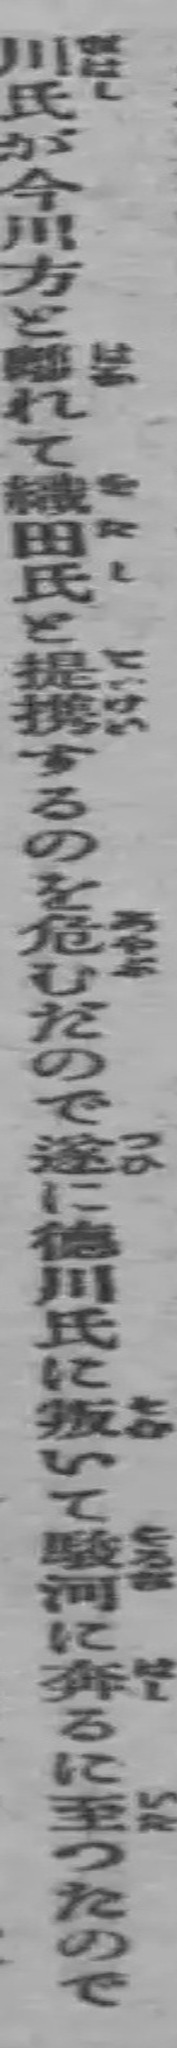川氏が今川方と離れて織田氏と提携するのを危むだので遂に徳川氏に叛いて駿河に奔るに至つたので
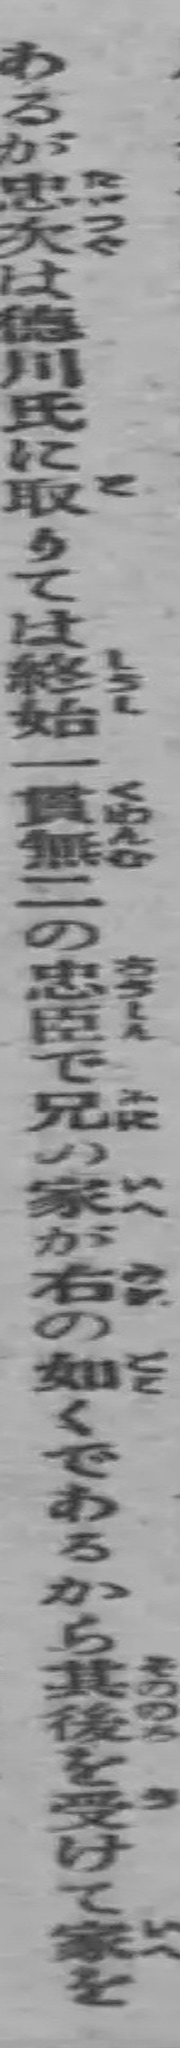あるが忠次は徳川氏に取りては終始一貫無二の忠臣で兄の家が右の如くであるから其後を受けて家を
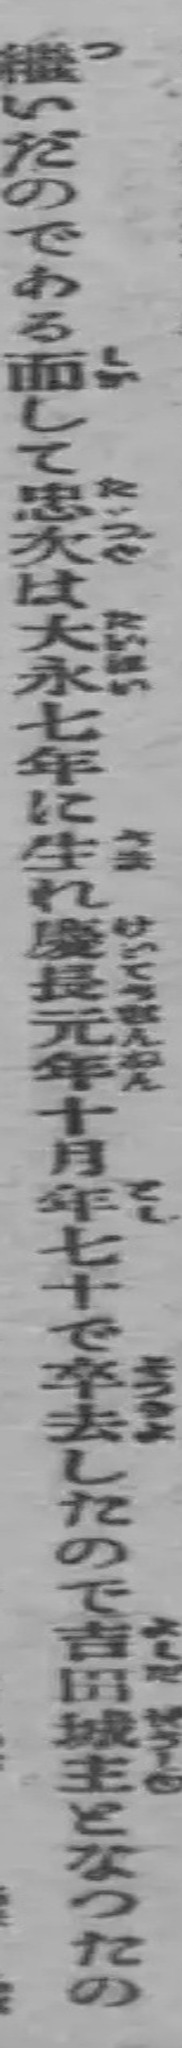継いだのである而して忠次は大永七年に生れ慶長元年十月年七十で卒去したので吉田城主となつたの
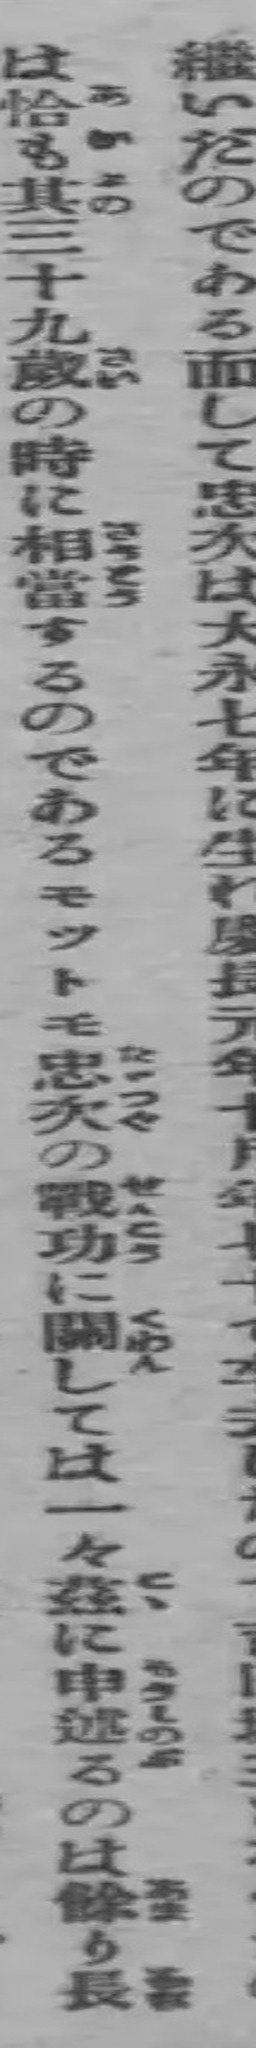は恰も其三十九歳の時に相当するのであるモツトモ忠次の戦功に関しては一々茲に申述るのは余り長
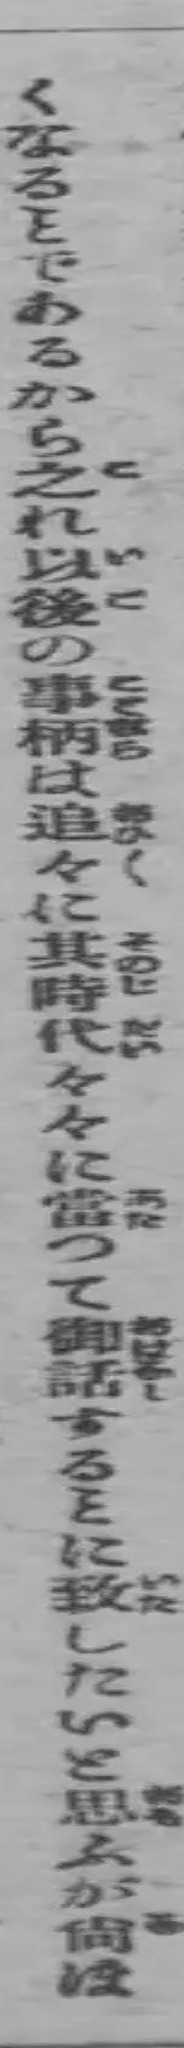くなることであるから之れ以後の事柄は追々に其時代々々に当つて御話することに致したいと思ふが尚ほ
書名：豊橋市史談
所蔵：国立国会図書館 National Diet Library, JAPAN
